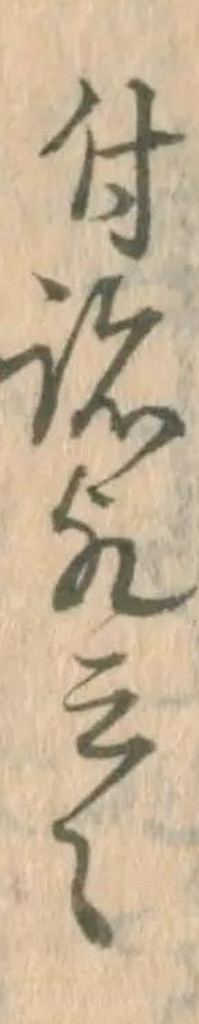付跡歟云々
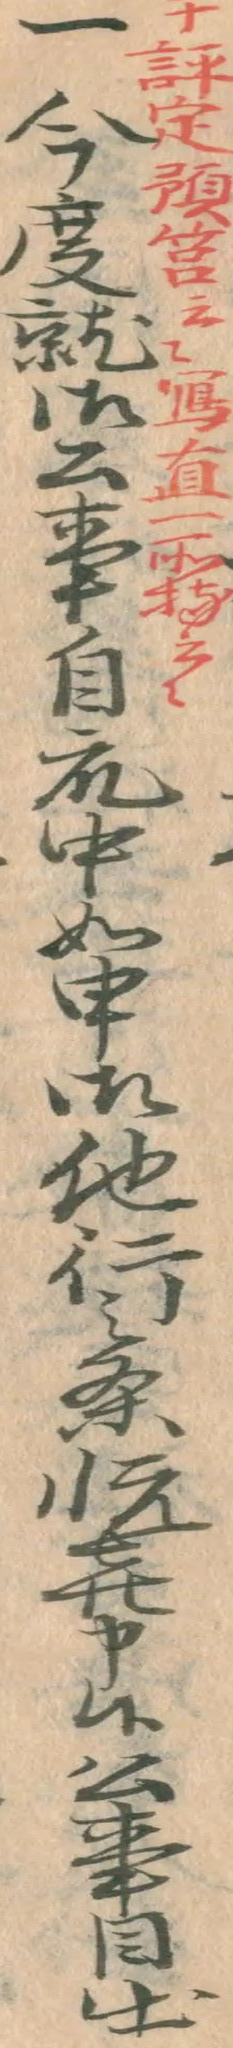一、今度就御公事自衆中如申御他行之条悦喜申候公事目出
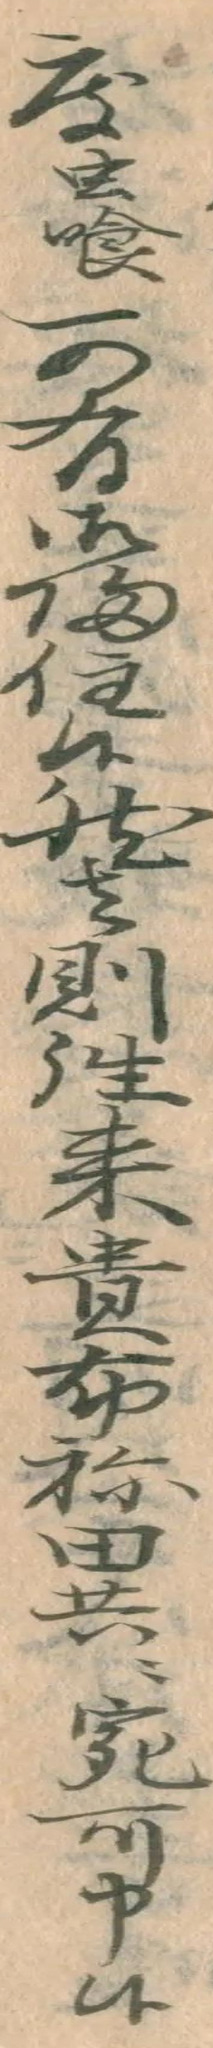度虫喰可有御帰住候然者則往来貴布称田共ニ宛可申候
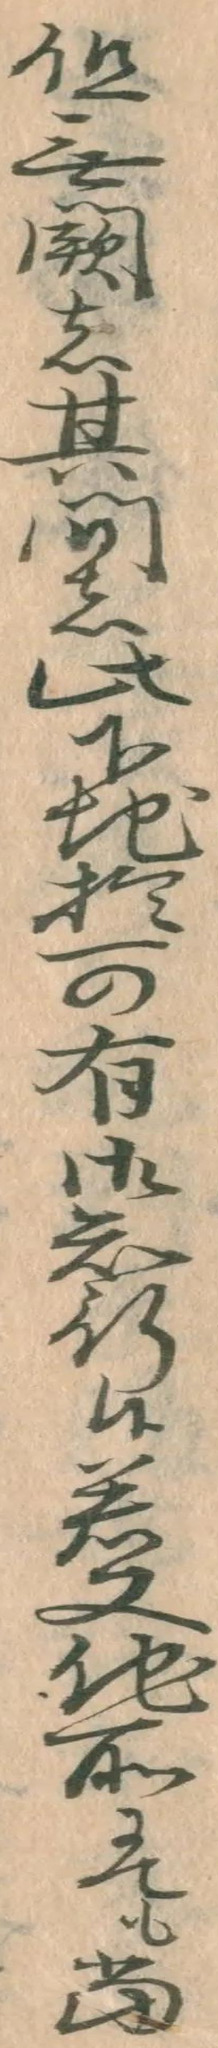但無闕者其間者此下地於可有御知行候若又他所にても當
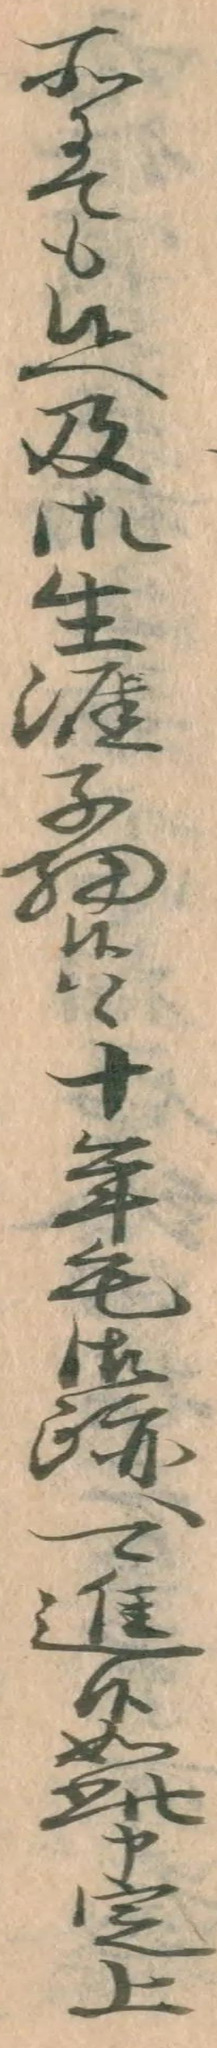所にても候へ及御生涯子細候ハヽ十年も御跡へ可進候如此申定上
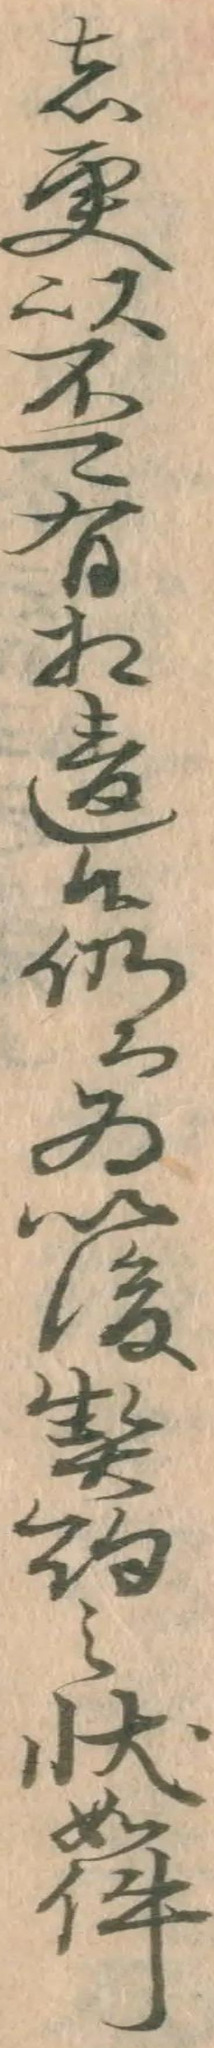者更以不可有相違候仍而為以後契約之状如件
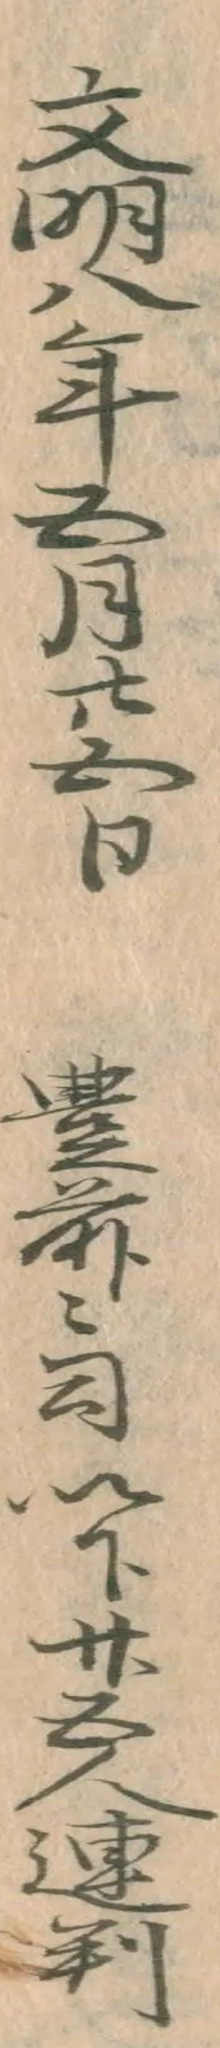文明八年五月廿五日豊前々司以下廿五人連判
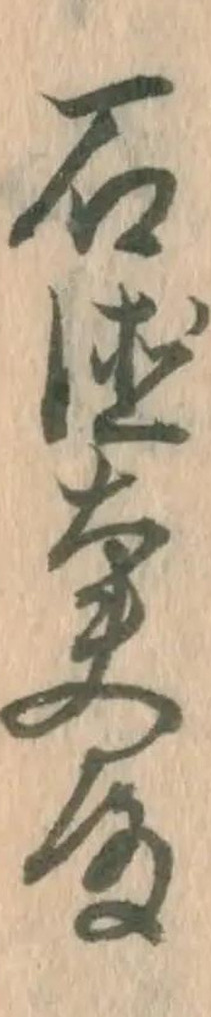石徳大夫殿
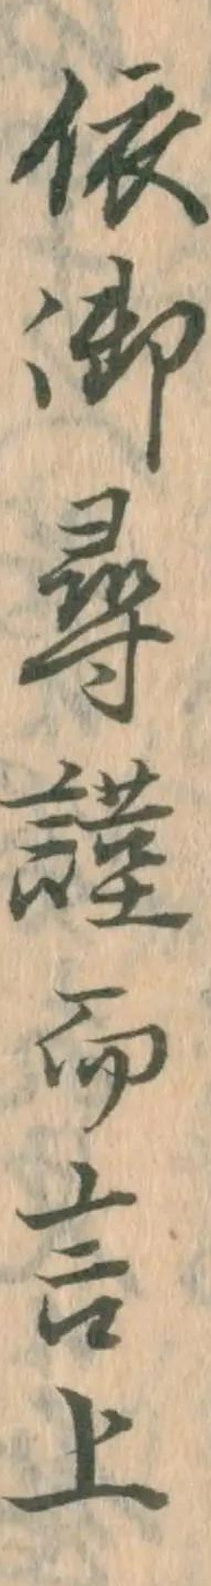依御尋謹而言上
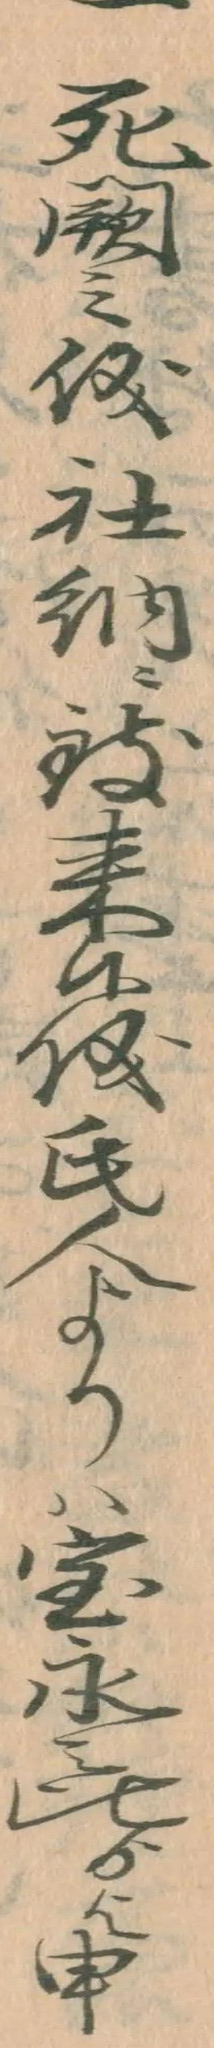一、死闕之儀社納ニ被来候儀氏人よりハ宝永之頃ゟ歟申
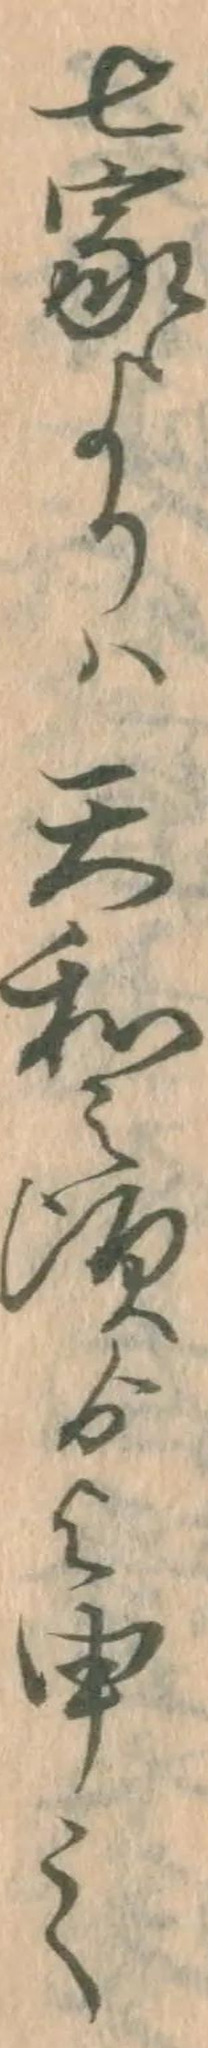七家よりは天和之頃ゟ歟申也
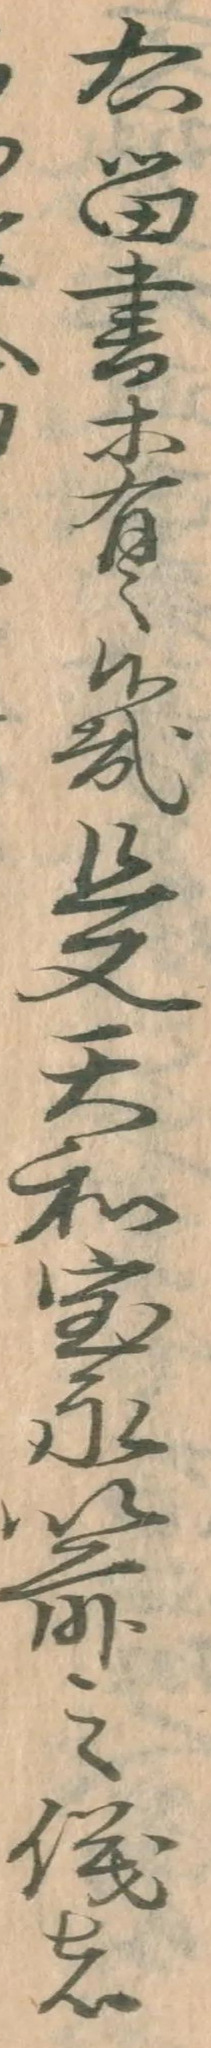右留書等有之候哉且又天和宝永以前之儀者
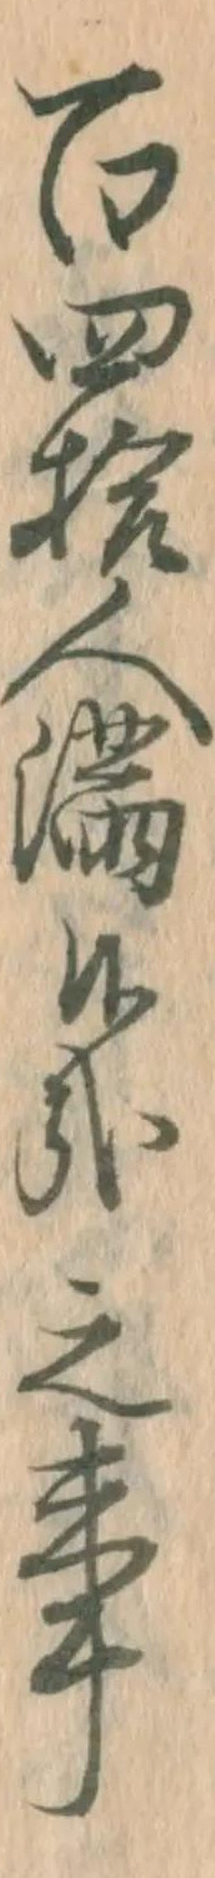百四拾人満候哉之事
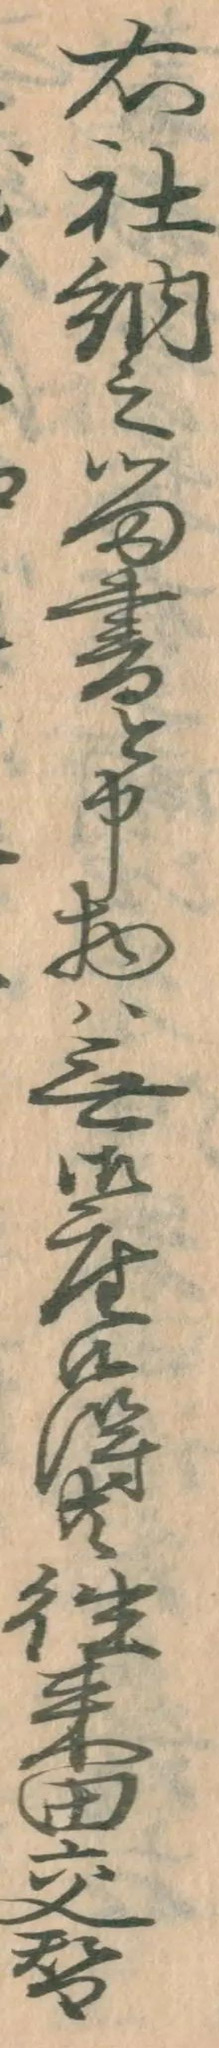右社納之留書と申物ハ無御座候得共往来田交替
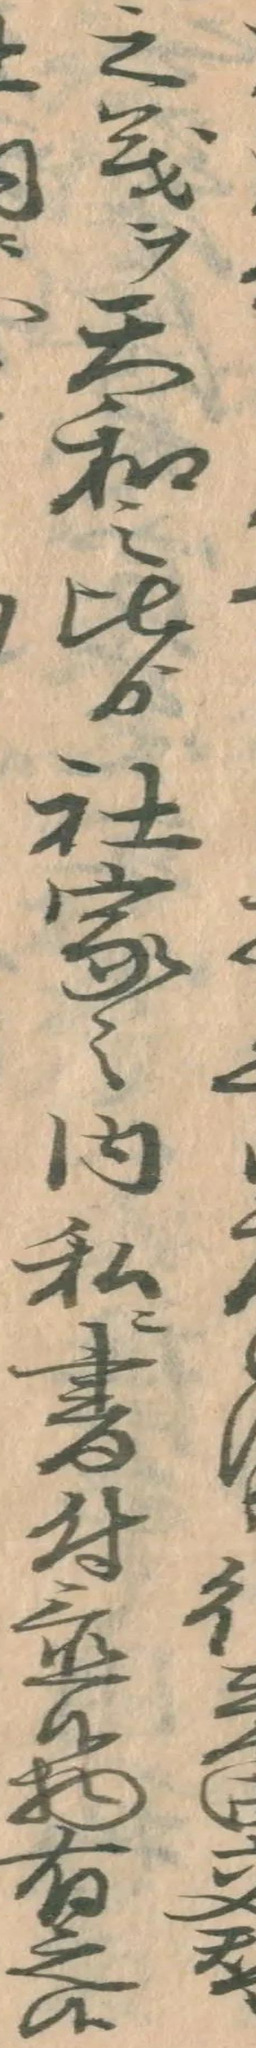之義ヲ天和之比ゟ社家之内私ニ書付置候物有之候
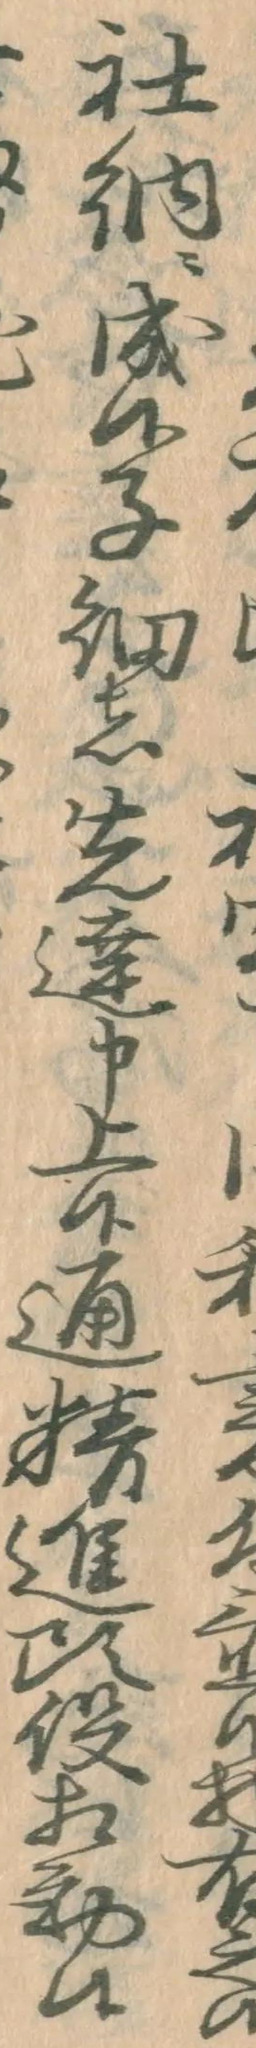社納ニ成候子細者先達申上候通精進改役相勤候
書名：賀茂社記録. 第39冊
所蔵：国立国会図書館 National Diet Library, JAPAN
